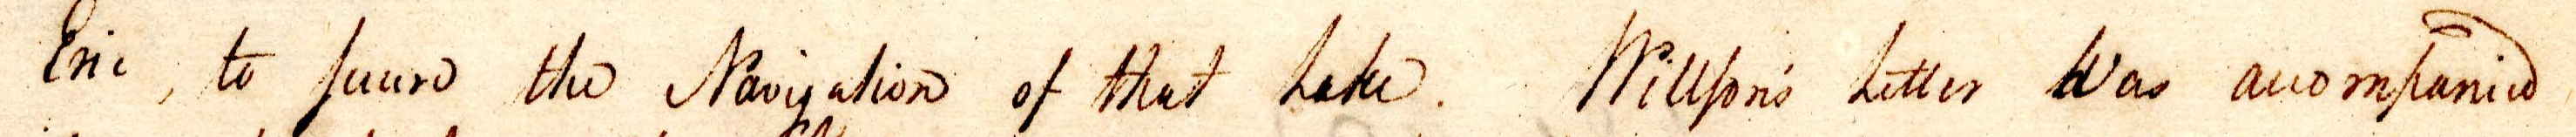Erie, to guard the Navigation of that Lake. Willson's Letter Was accompanied
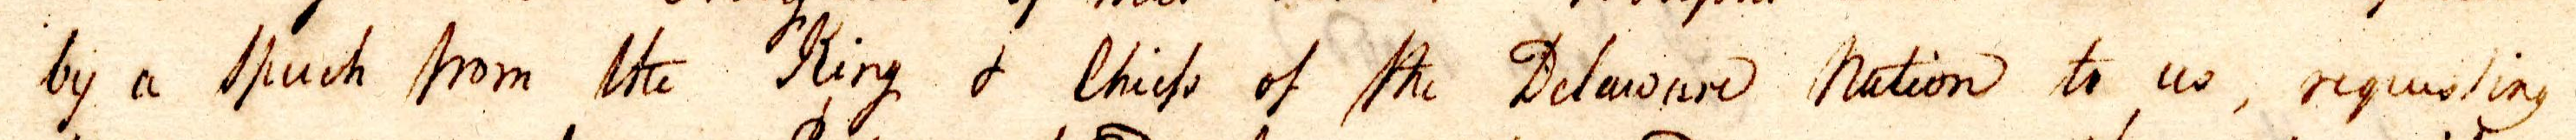by a Speech from the King & Chiefs of the Delaware Nation to us, requesting
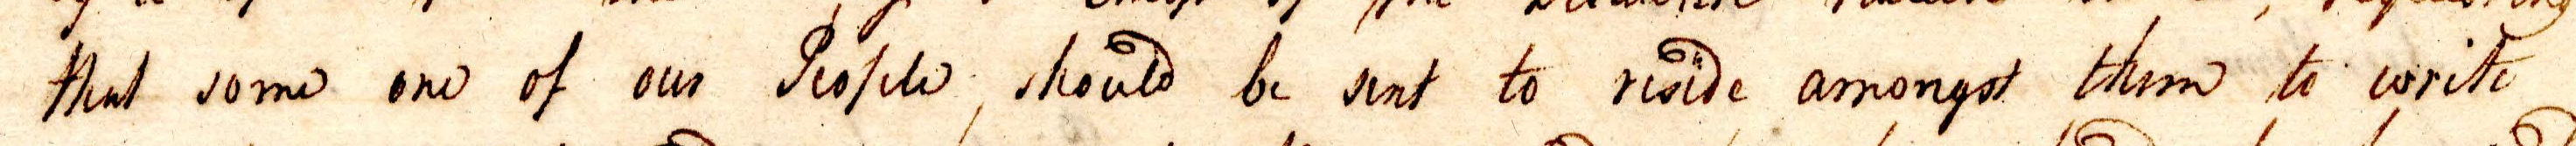that some one of our People should be sent to reside amongst them to write
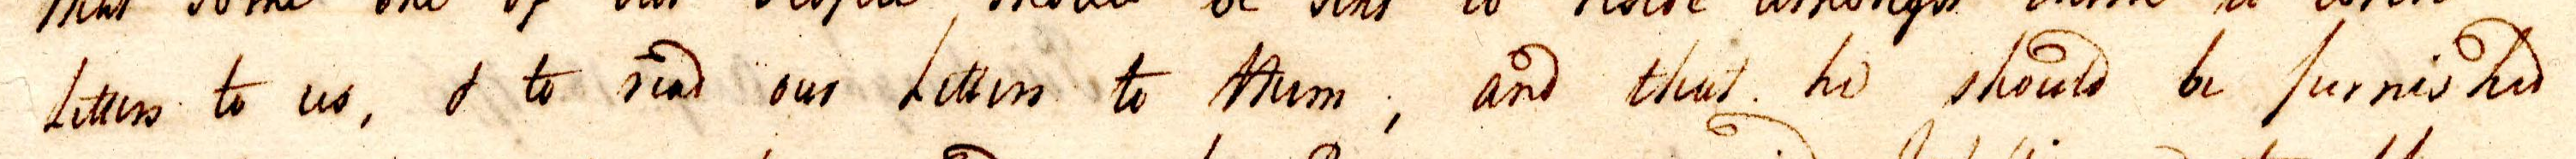Letters to us, & to read our Letters to them, and that he should be furnished
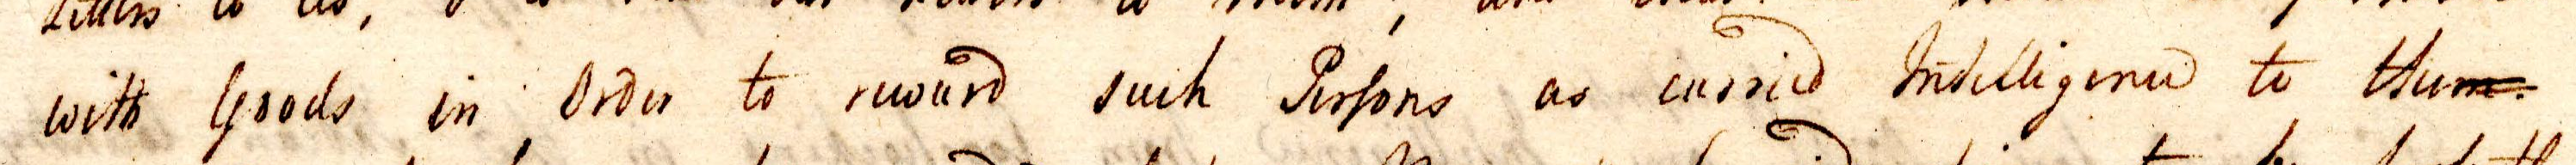with Goods in Order to reward such Persons as carried Intelligence to the
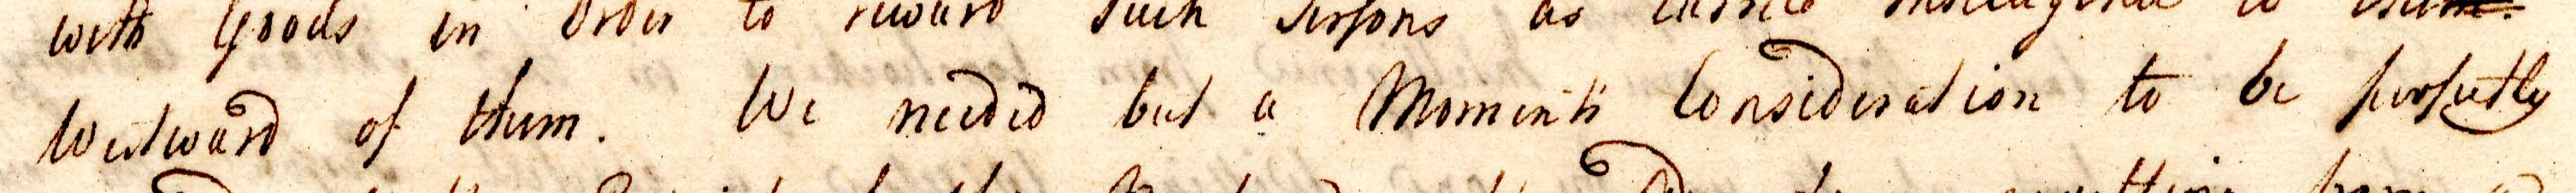Westward of them. We needed but a Moments Consideration to be perfectly
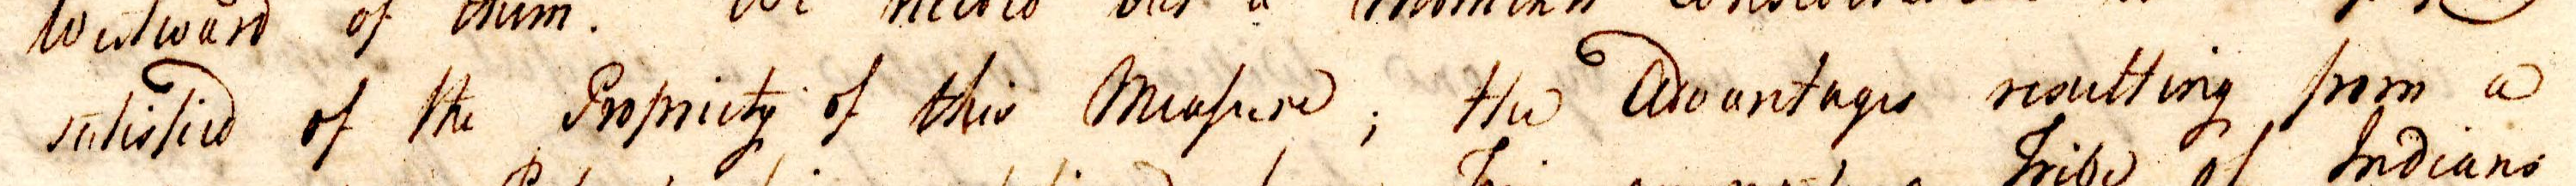satisfied of the Propriety of this Measure; the Advantages resulting from a
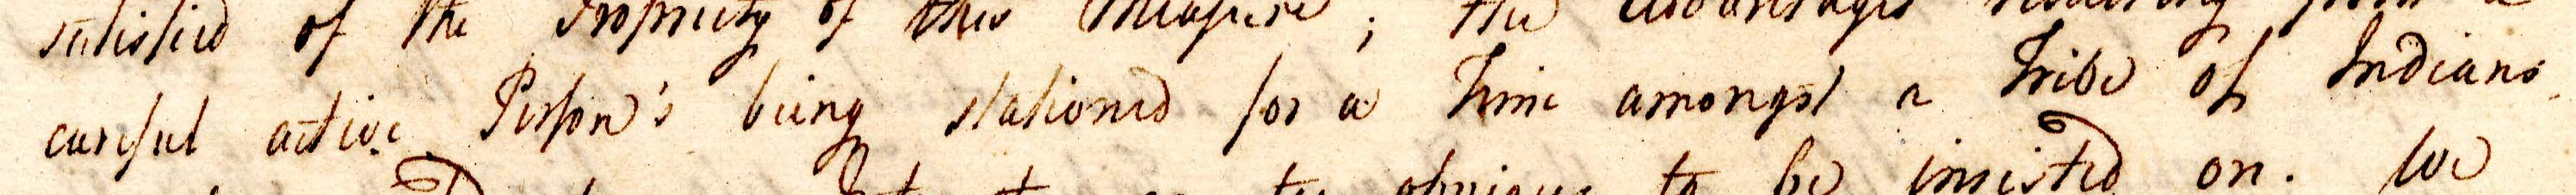careful active Person's being stationed for a Time amongst a Tribe of Indians
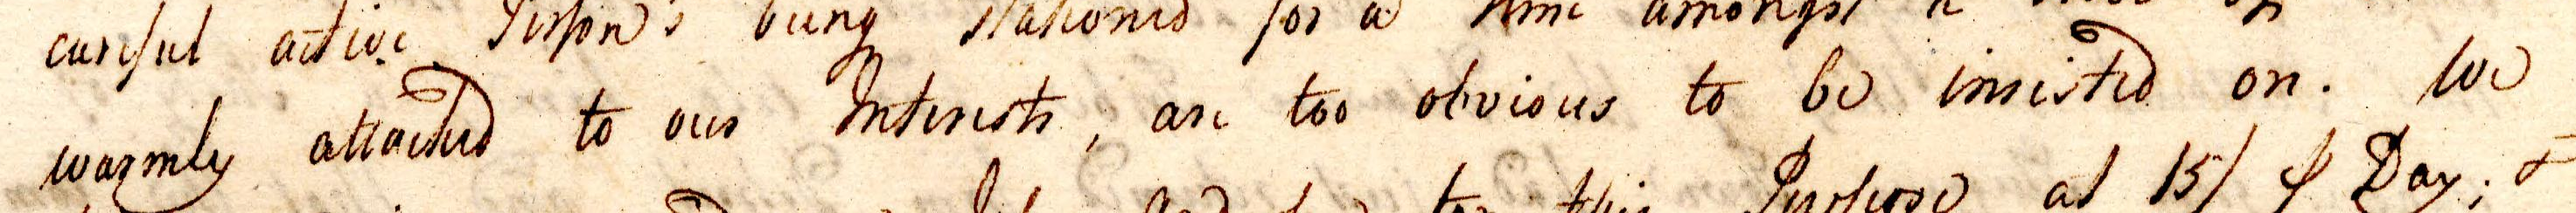warmly attached to our Interests are too obvious to be insisted on. We
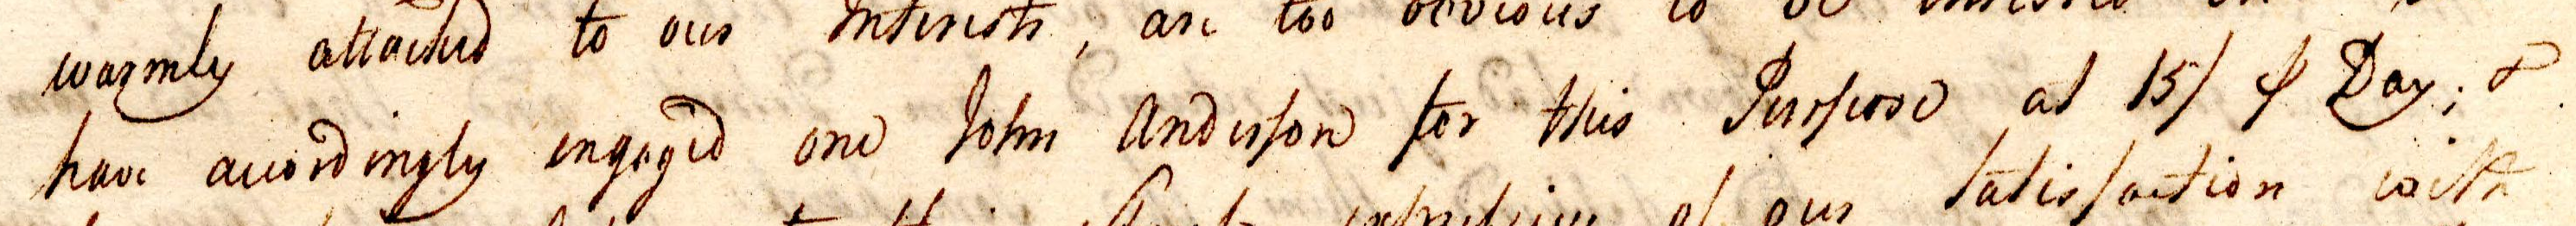have accordingly engaged one John Anderson for this Purpose at 15/ per Day; &
